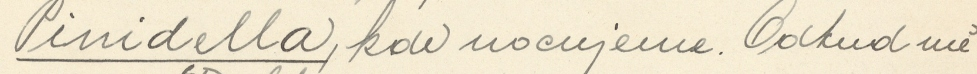Pinidella, kde nocujeme. Odkud mě-
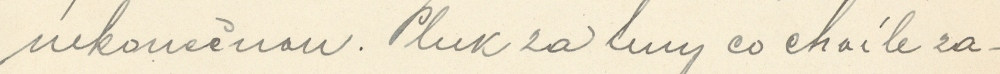nekonečnou. Pluk za tmy co chvíle za-
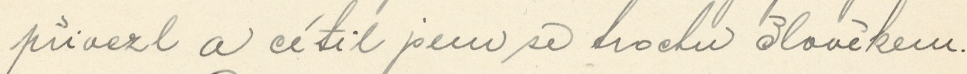přivezl a cítil jsem se trochu člověkem.
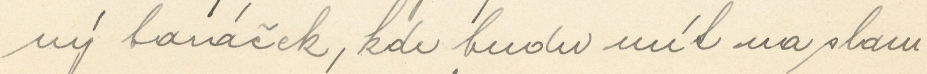ný baráček, kde budu mít na slam-
